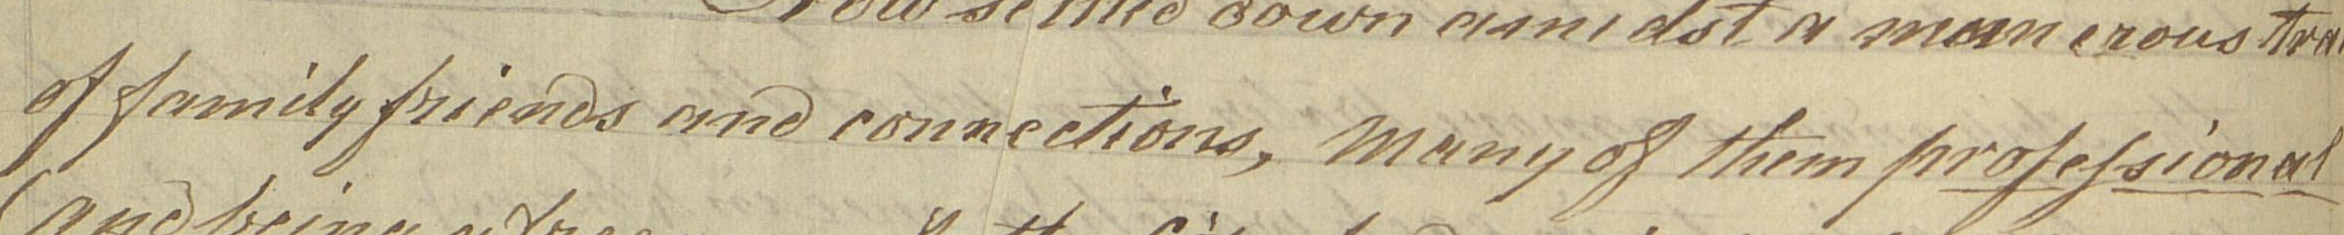of family friends and connections, Many of them professional
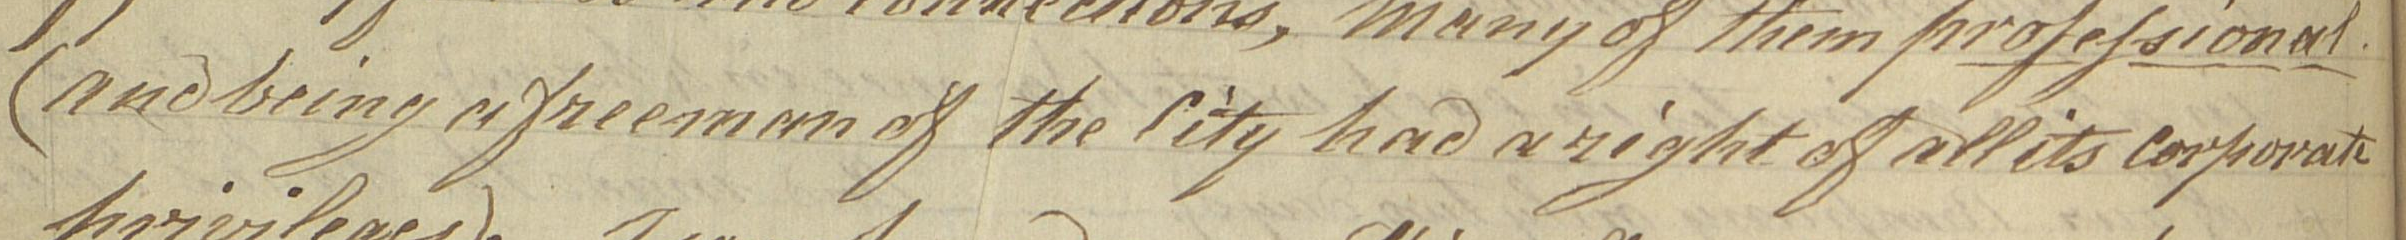(and being a freeman of the City had a right of all its corporate
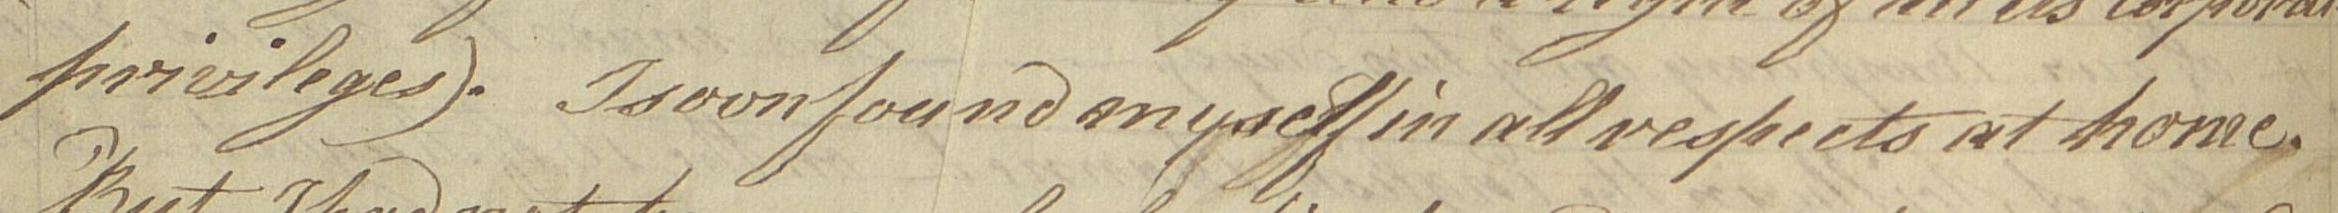privileges). I soon found myself in all respects at home.
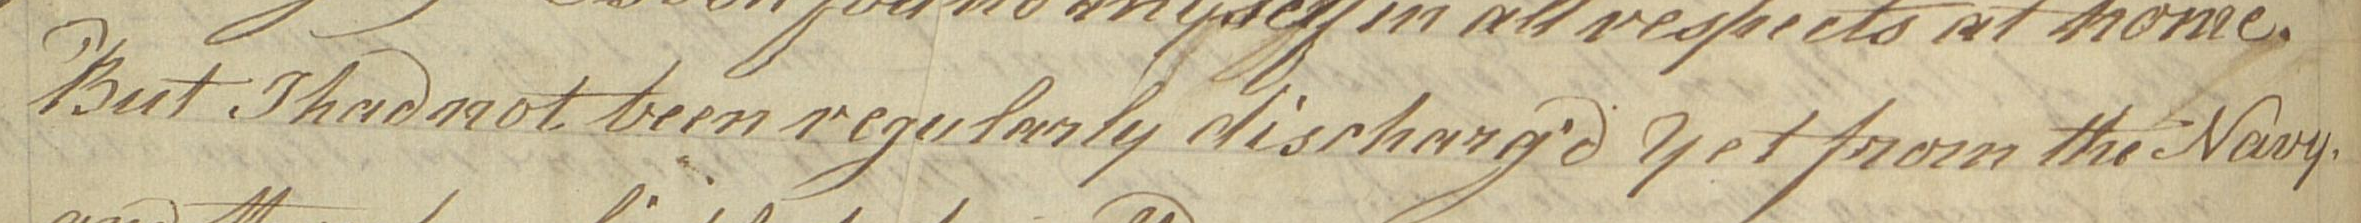But I had not been regularly discharg'd yet from the Navy
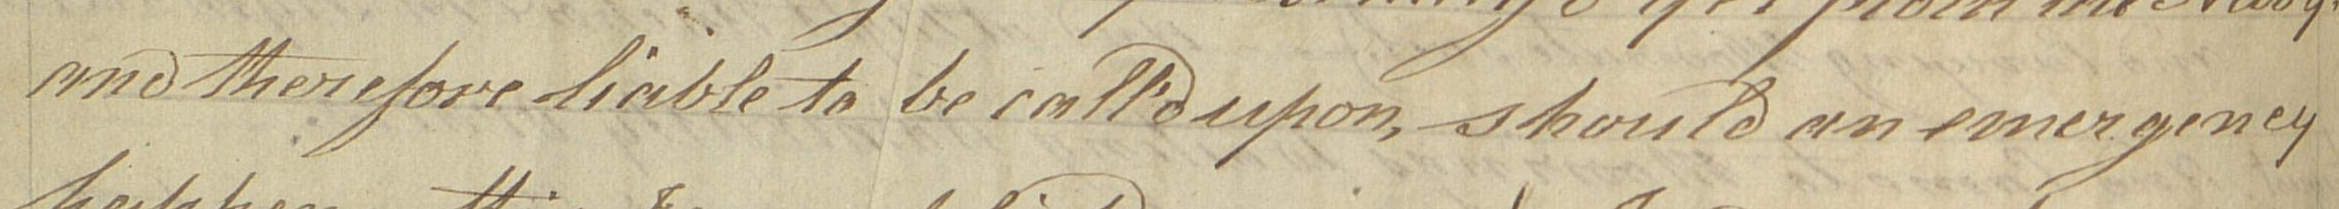and therefore liable to be call'd upon, should an emergency
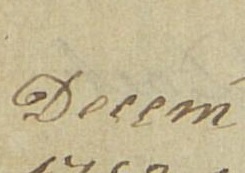Decem^r
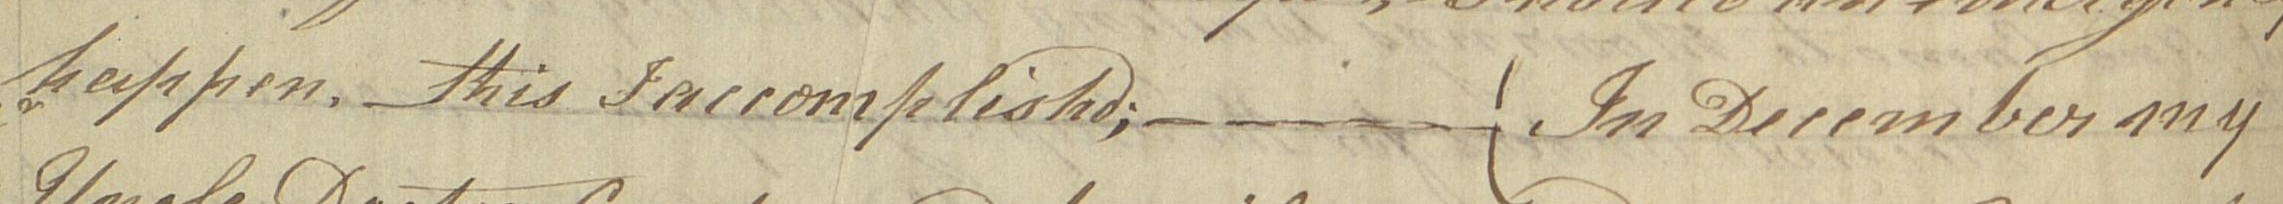happien, this I accomplish'd; (In December my
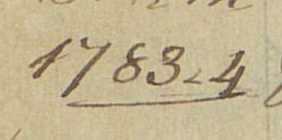1783-4
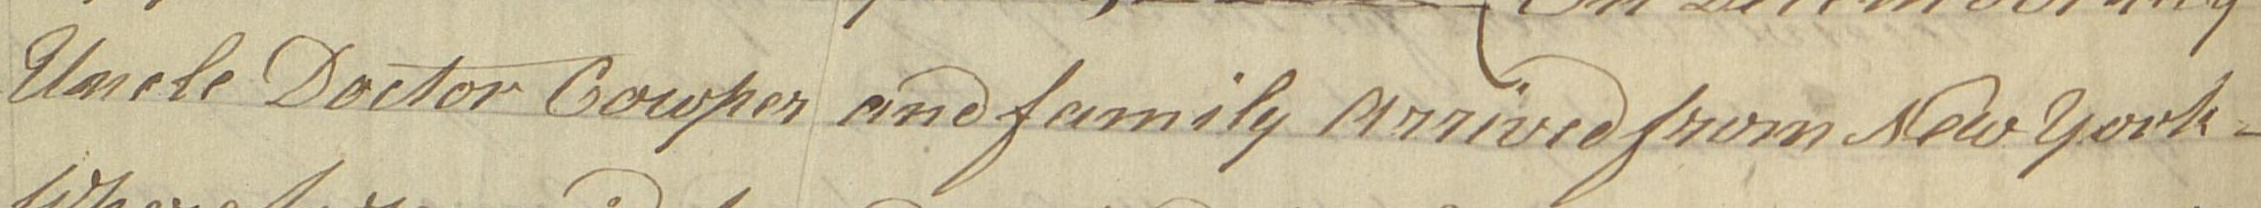Uncle Doctor Cowper and family arrived from New York
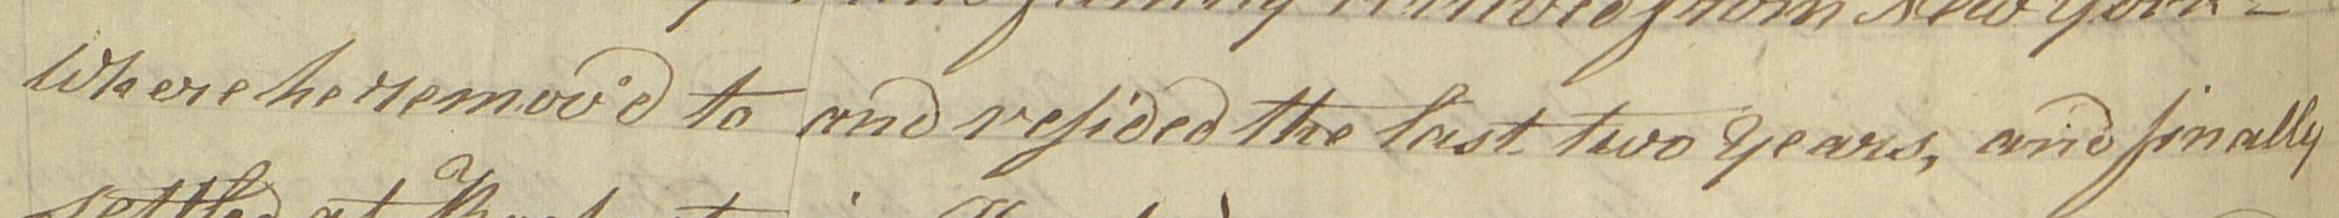Where he remov'd to and resided the last two years, and finally
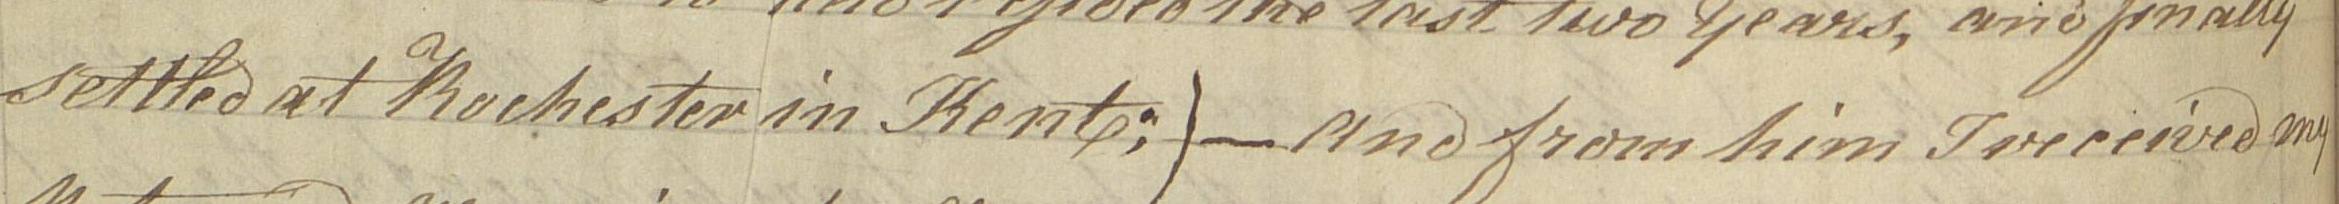settled at Rochester in Kent;) And from him I received my
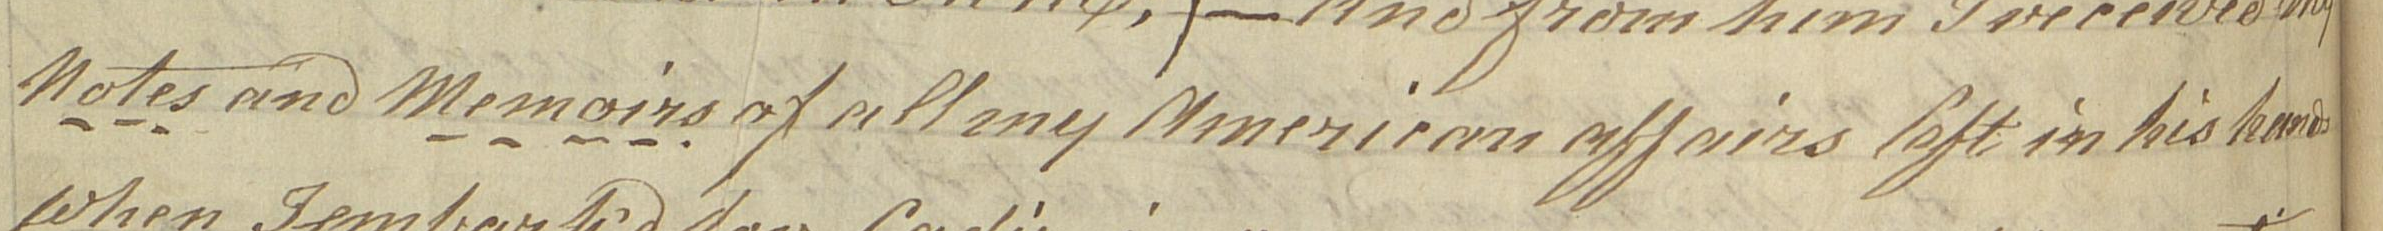Notes and Memoirs of all my American affairs left in his hands
